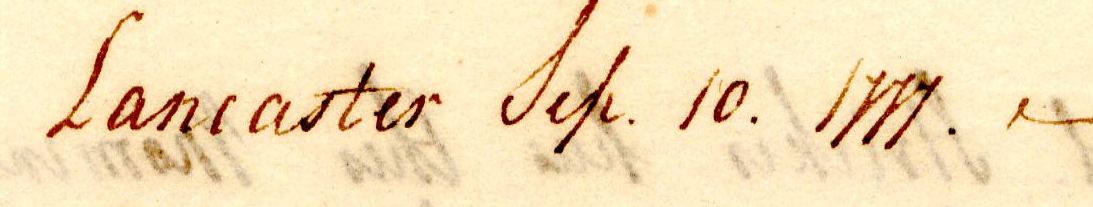Lancaster Sep. 10. 1777.
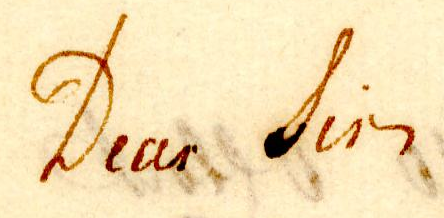Dear Sir
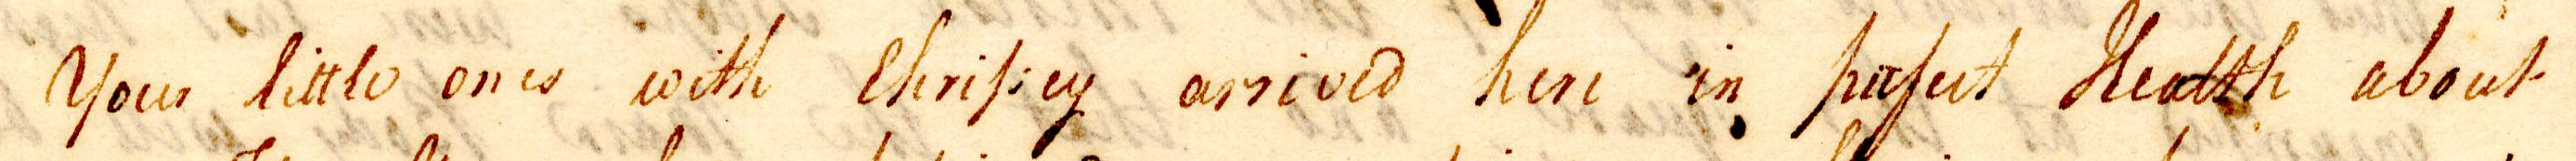Your little ones with Chrissey arrived here in perfect Health about
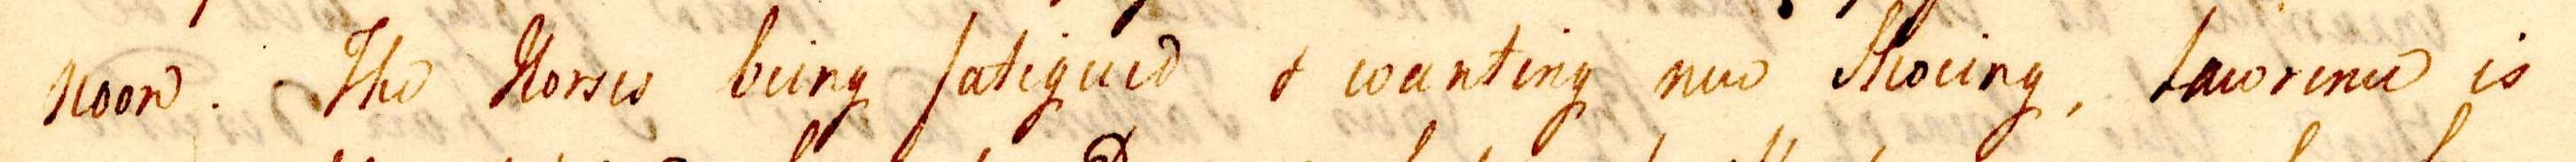noon. The Horses being fatigued & wanting new Shoeing, Lawrence is
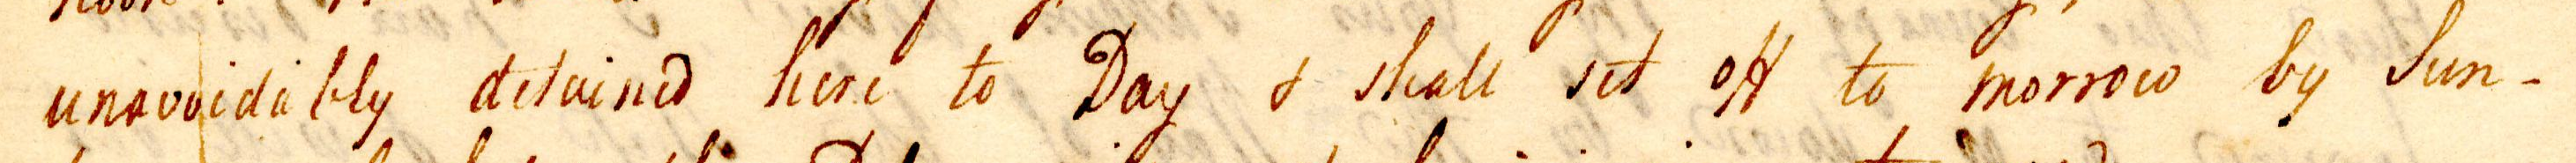unavoidably detained here to Day & shall set off to morrow by Sun-
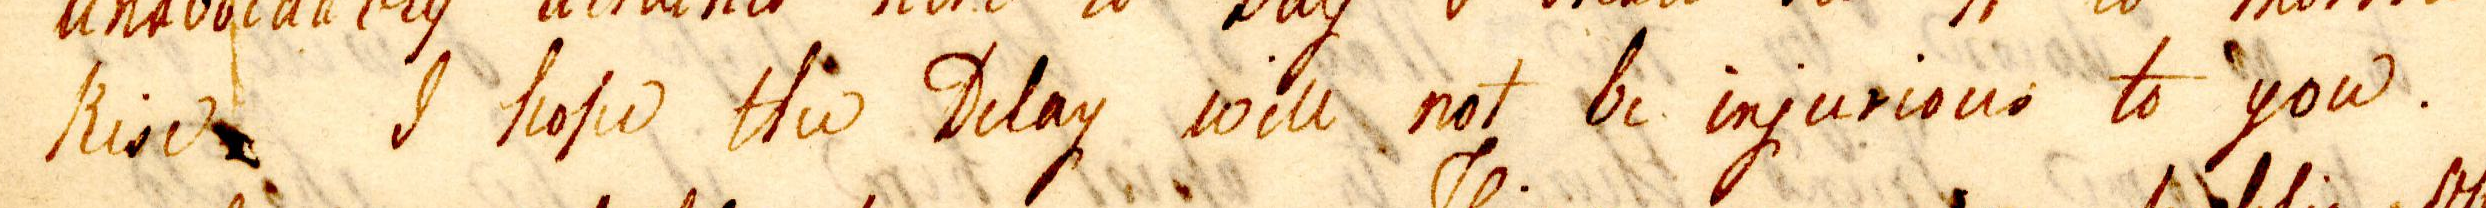Rise. I hope the Delay will not be injurious to you.
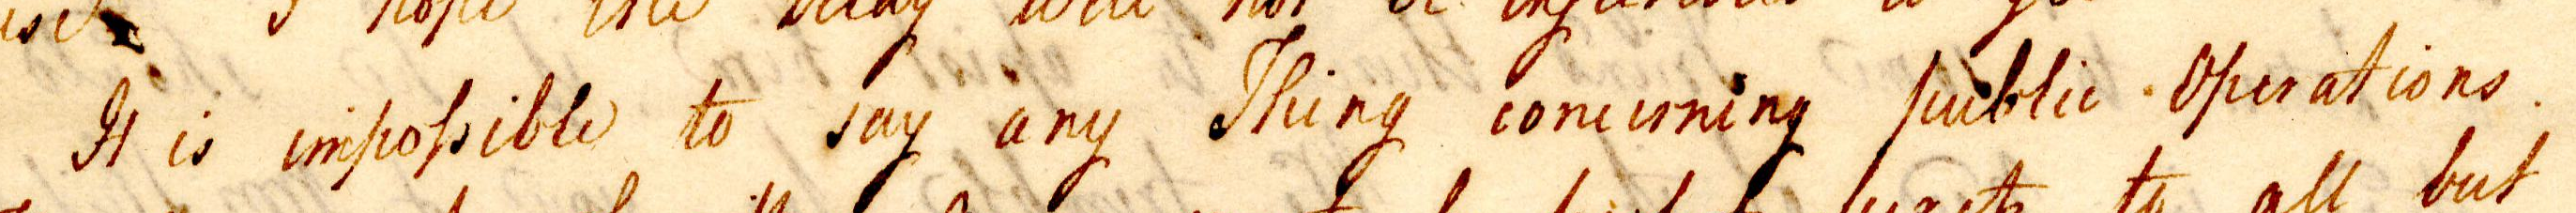It is impossible to say any Thing concerning public Operations.
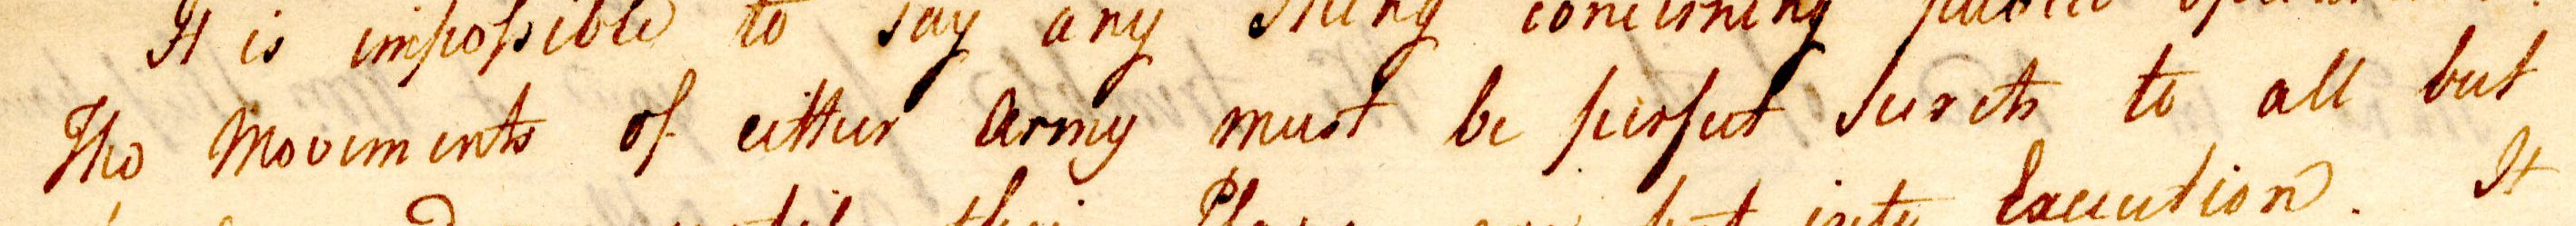Tho Movements of either Army must be perfect secrets to all but
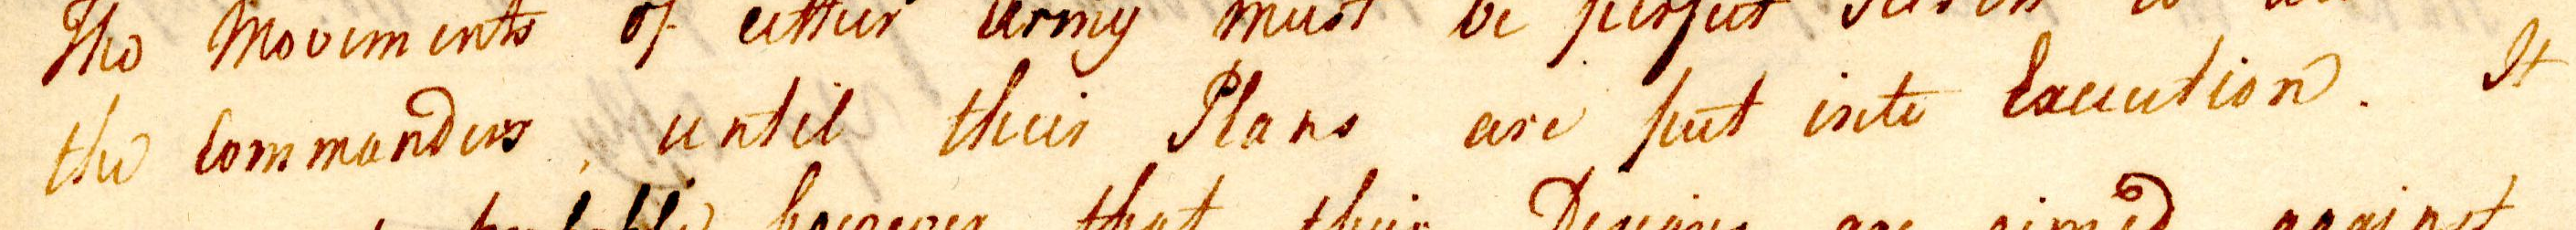the Commanders until their Plans are put into Execution. It
